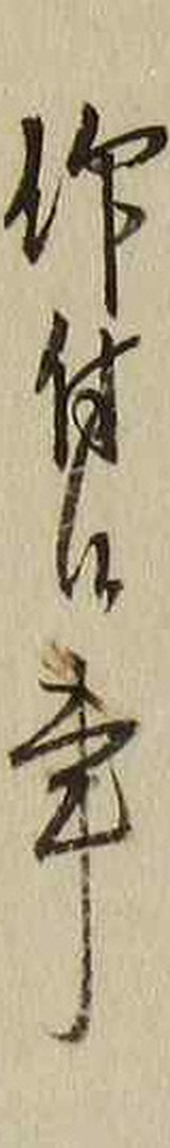仰付候事
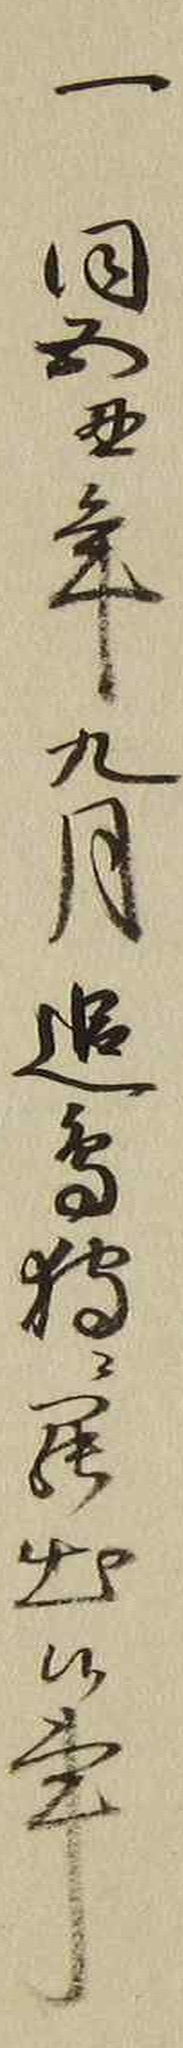一同五丑年九月追鳥狩ニ罷出候事
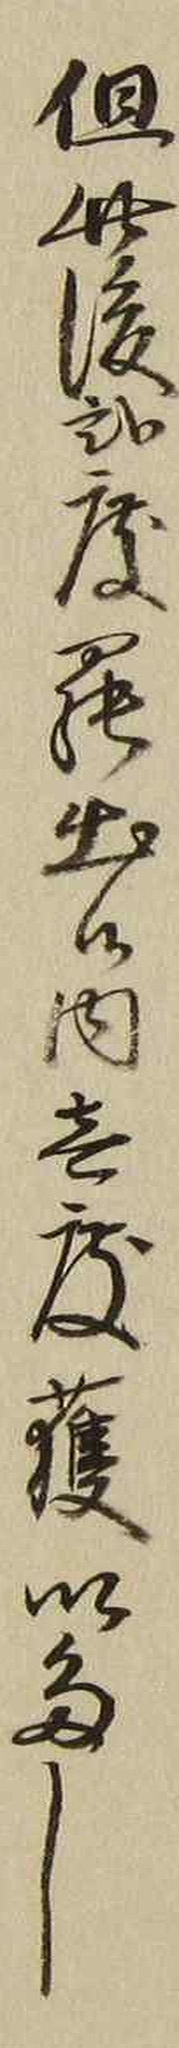但此後弐度罷出候内壱度獲いたし
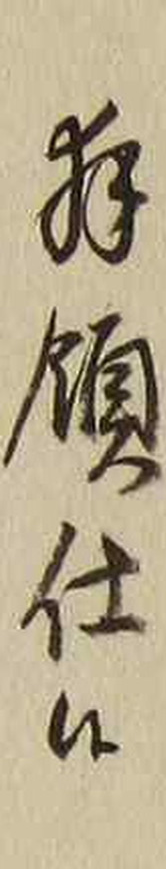拝領仕候
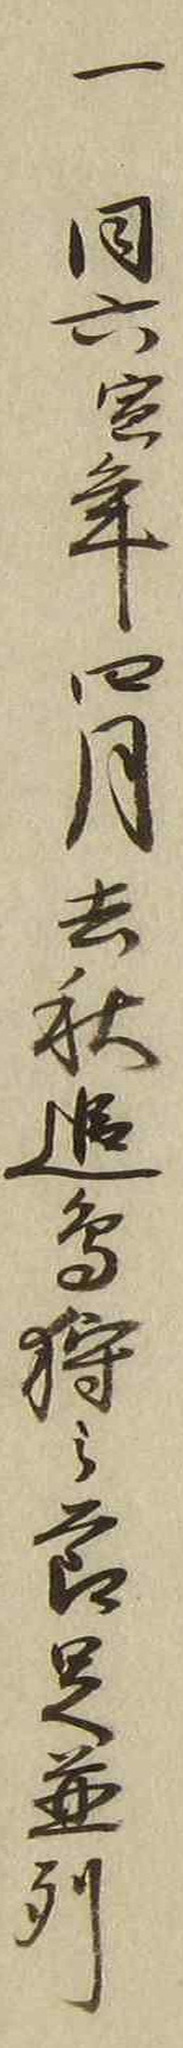一同六寅年四月去秋追鳥狩之節足並列

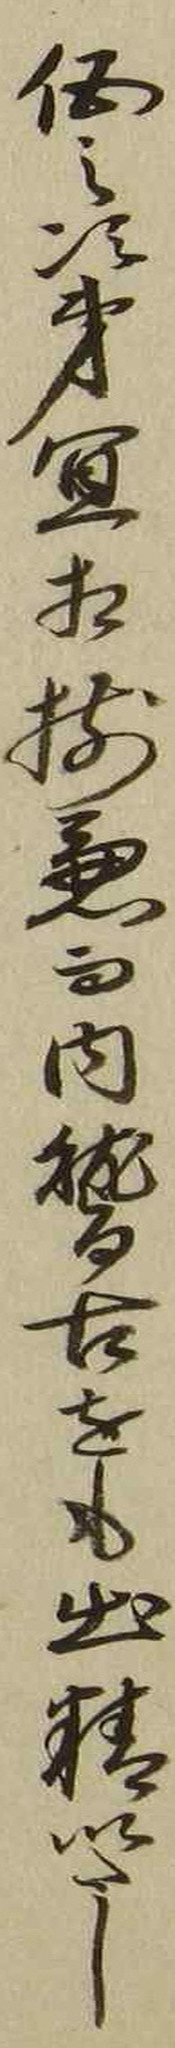伍之次第宜相揃兼而内稽古をも出精いたし
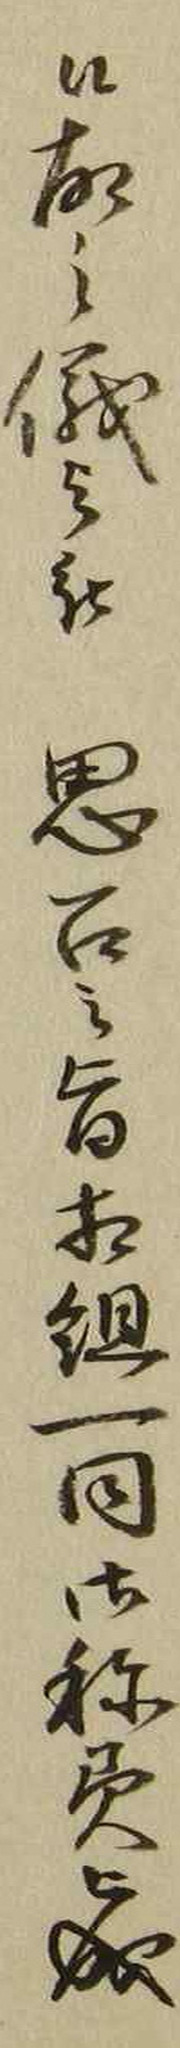候故之儀与被思召之旨相組一同御称美被成
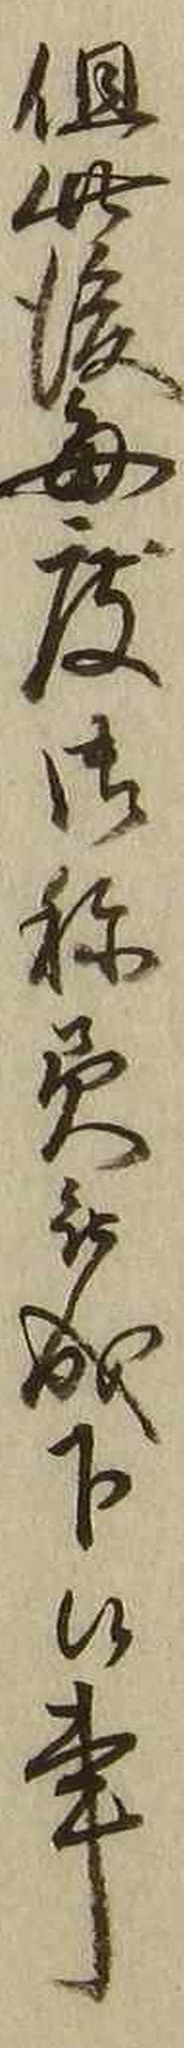但此後毎度御称美被成下候事
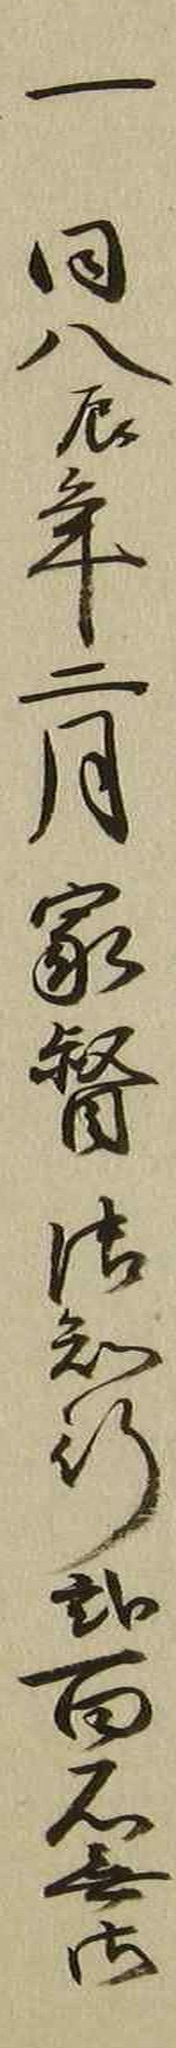一同八辰年二月家督御知行弐百石無御
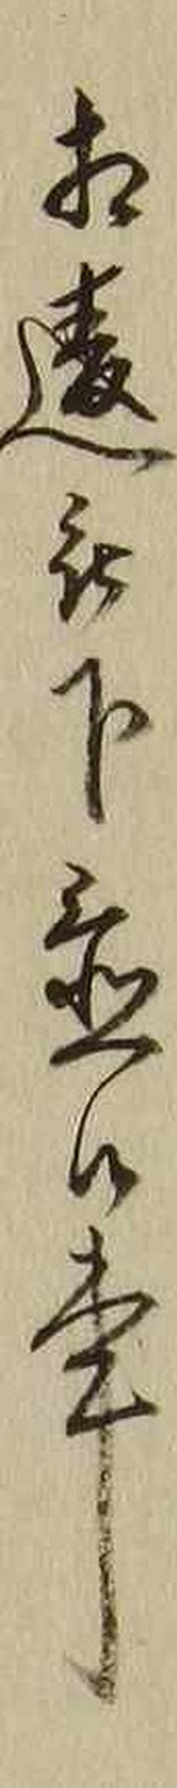相違被下置候事
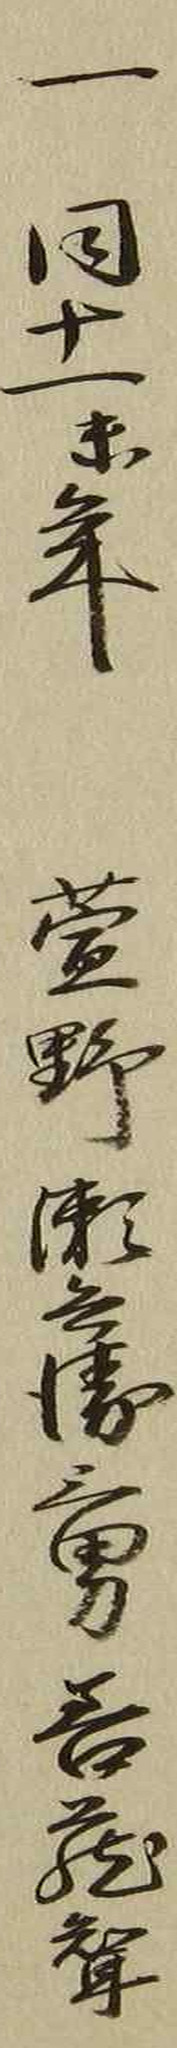一同十一未年萱野瀬兵衛三男善蔵婿
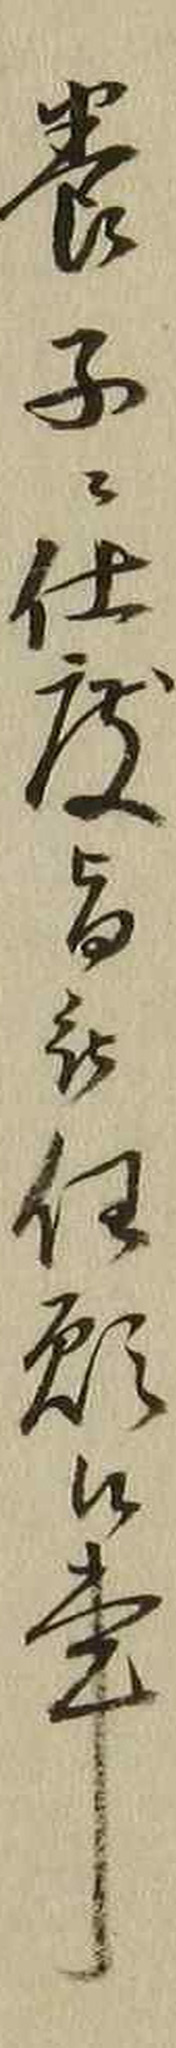養子ニ仕度旨被任願候事
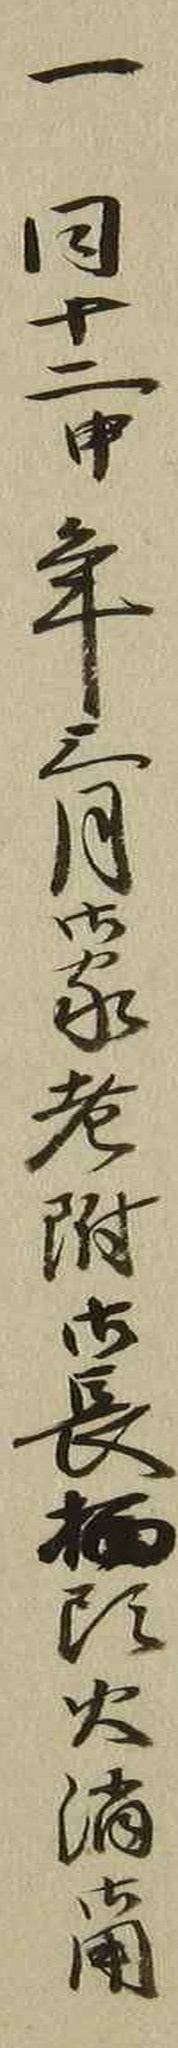一同十二申年三月御家老附御長柄頭火消御用
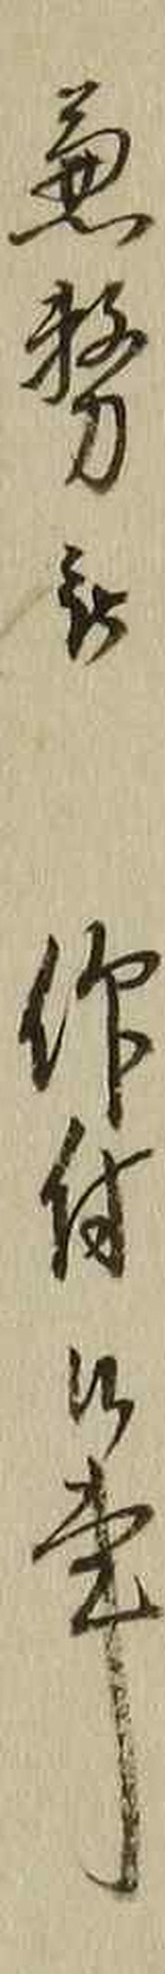兼務被仰付候事
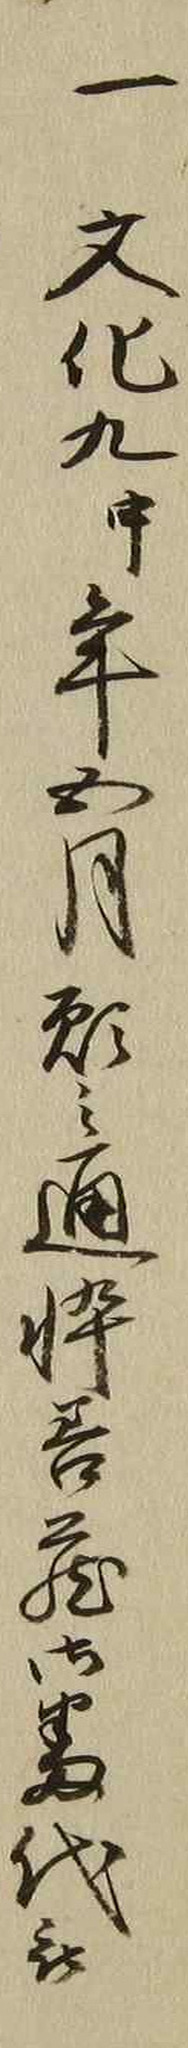一文化九申年五月願之通忰善蔵御番代被
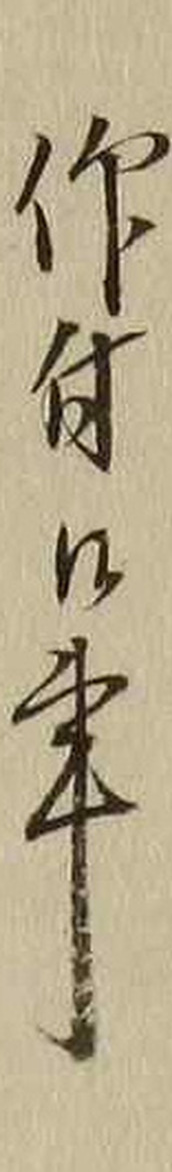仰付候事
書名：諸士系譜　巻之128　た之部4
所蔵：会津若松市立会津図書館
